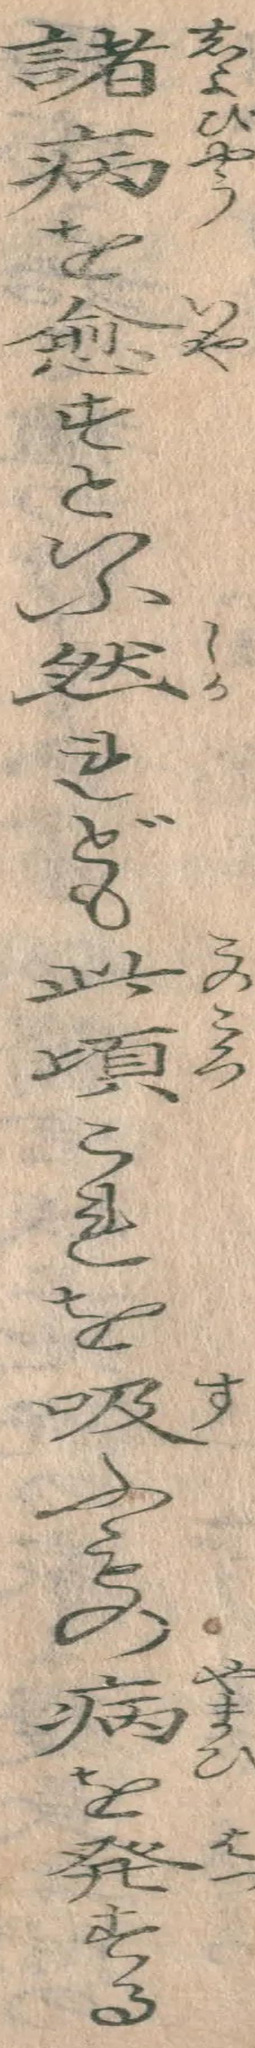諸病を愈すといふ然れども此頃これを吸ふもの病を発する
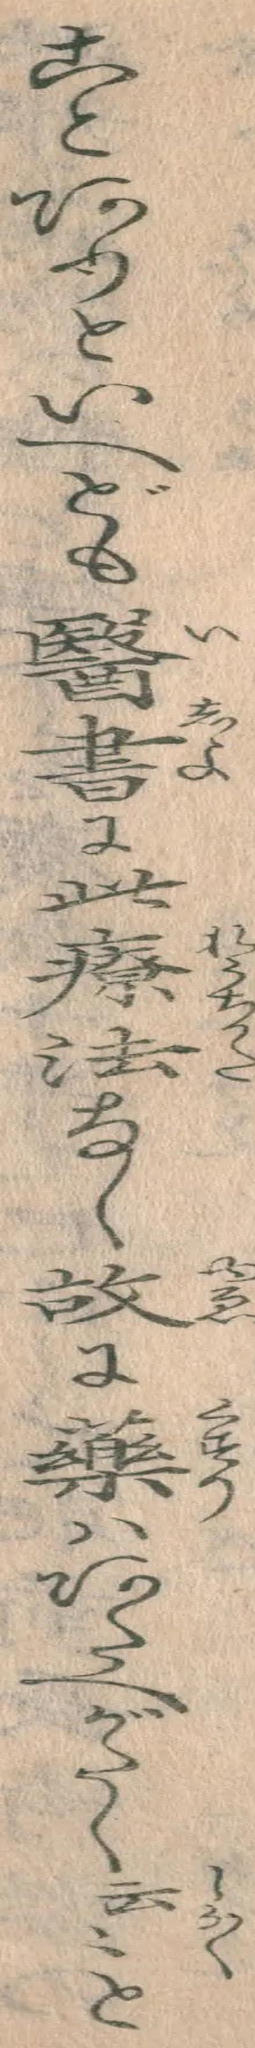ことありといへども医書に此療法なし故に薬はあたへがたし云々と
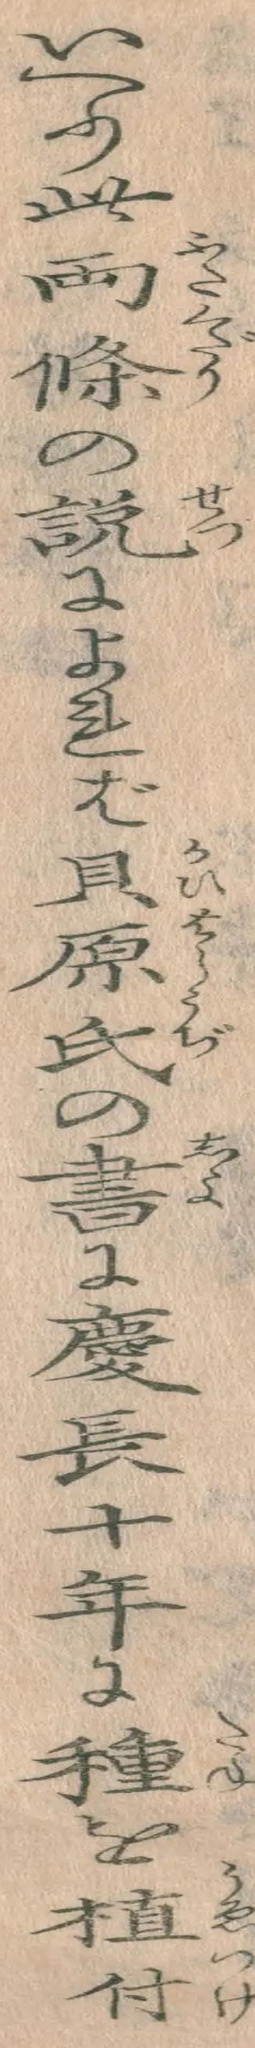いへり此両条の説によれば貝原氏の書に慶長十年に種を植付
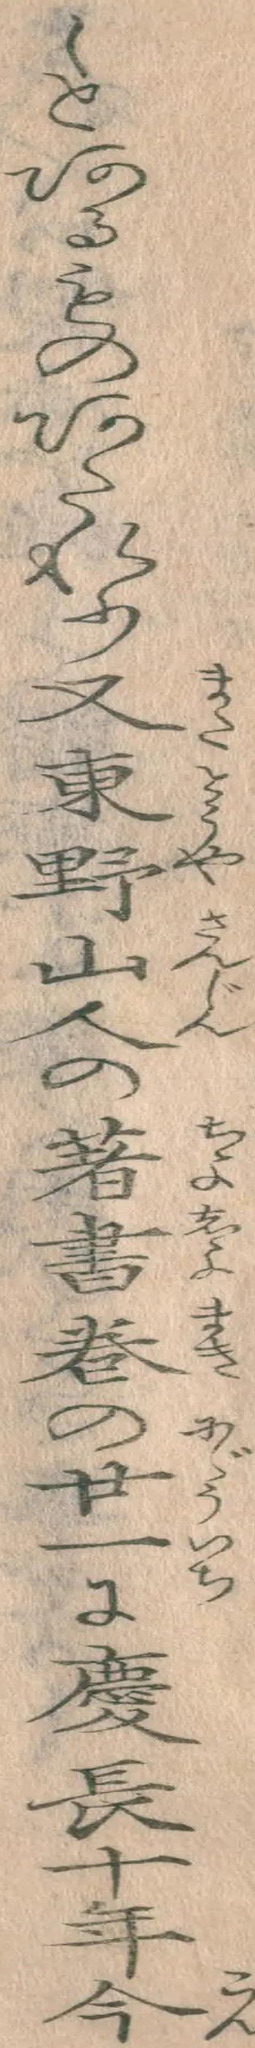しとあるものあたれり又東野山人の著書巻の廿一に慶長十年今
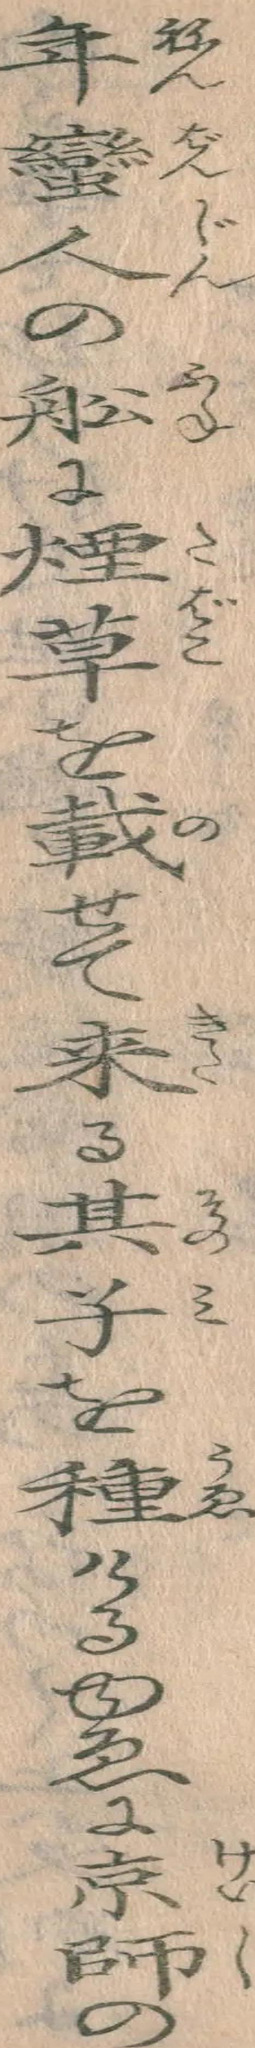年蛮人の船に煙草を載せて来る其子を種けるゆゑに京師の
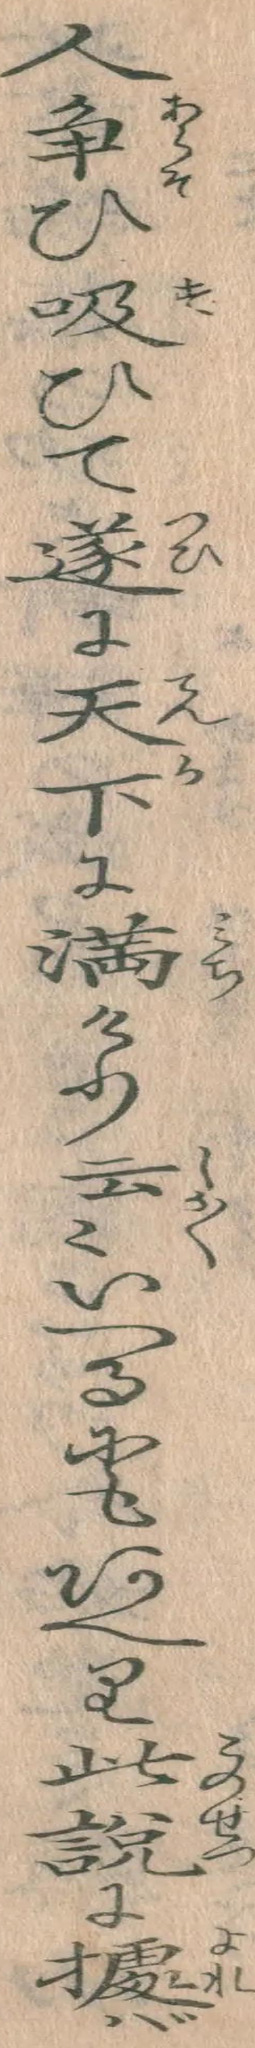人争ひ吸ひて遂に天下に満けり云々いへるにもあへり此説に拠ば
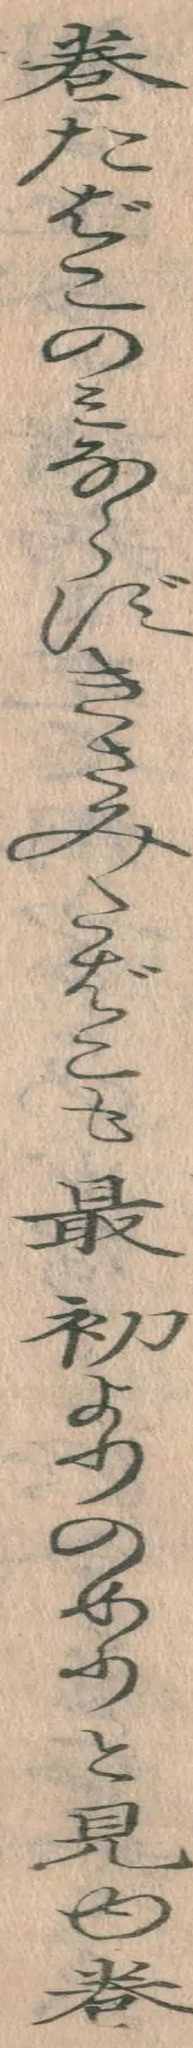巻たばこのみならずきさみたばこも最初よりのめりと見ゆ巻
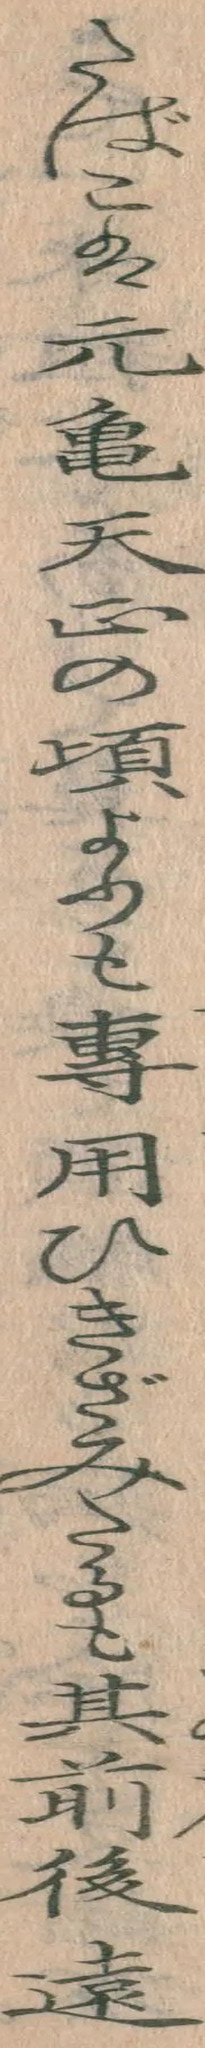たばこは元亀天正の頃よりも専用ひきざみたるも其前後遠
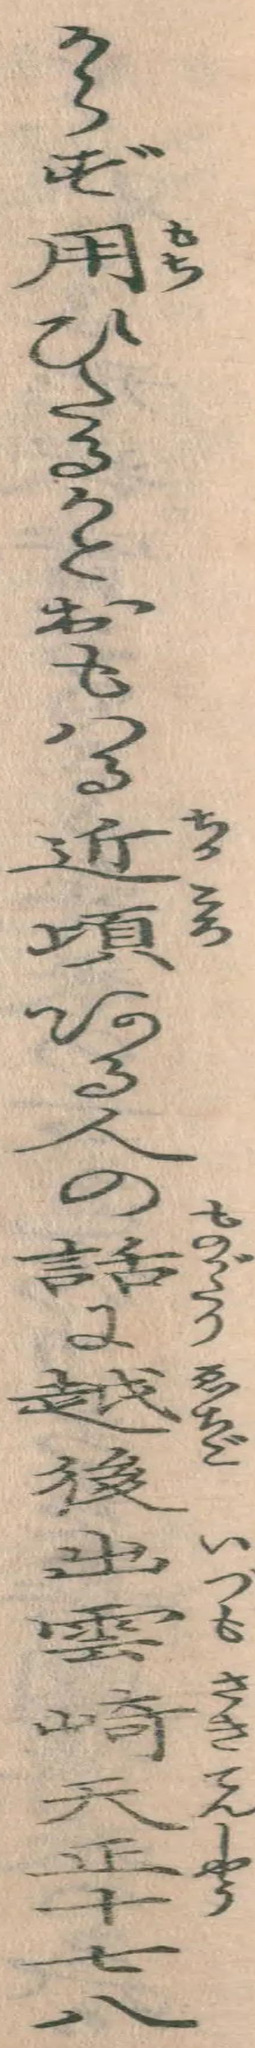からず用ひたるかとおもはる近頃ある人の話に越後出雲崎天正十七八
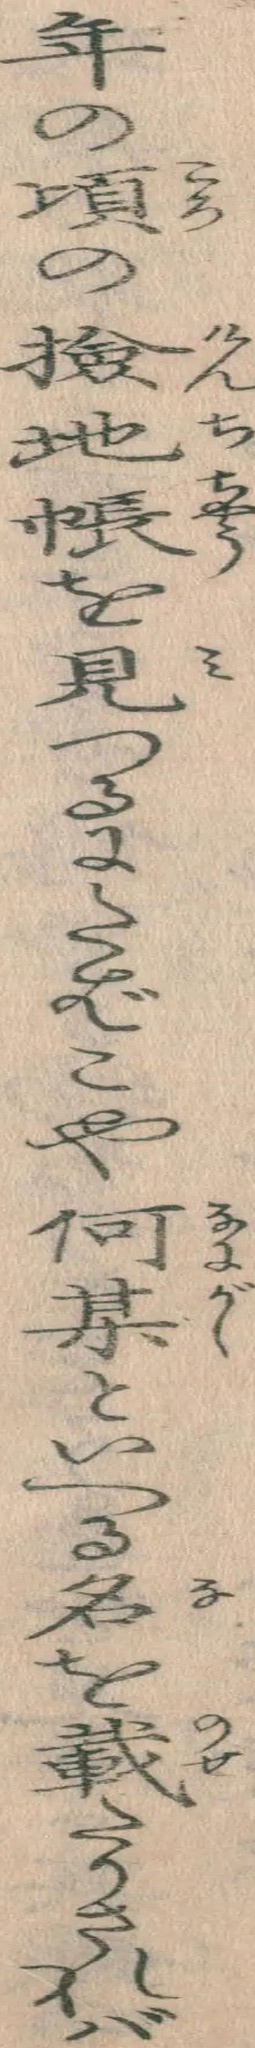年の頃の検地帳を見つるにたばこや何某といへる名を載たりされば
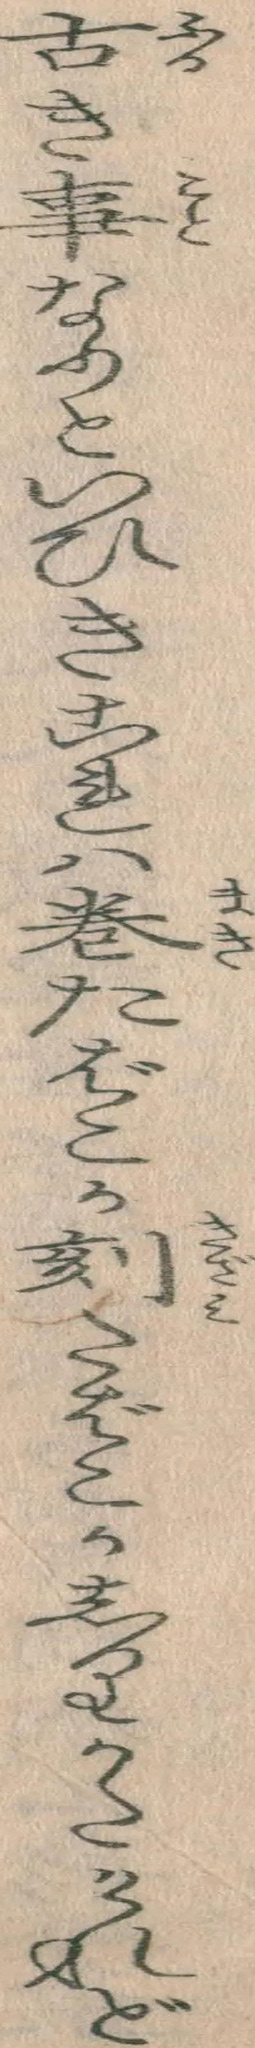古き事なりといひきこれは巻たばこか刻たばこかしりかたけれど
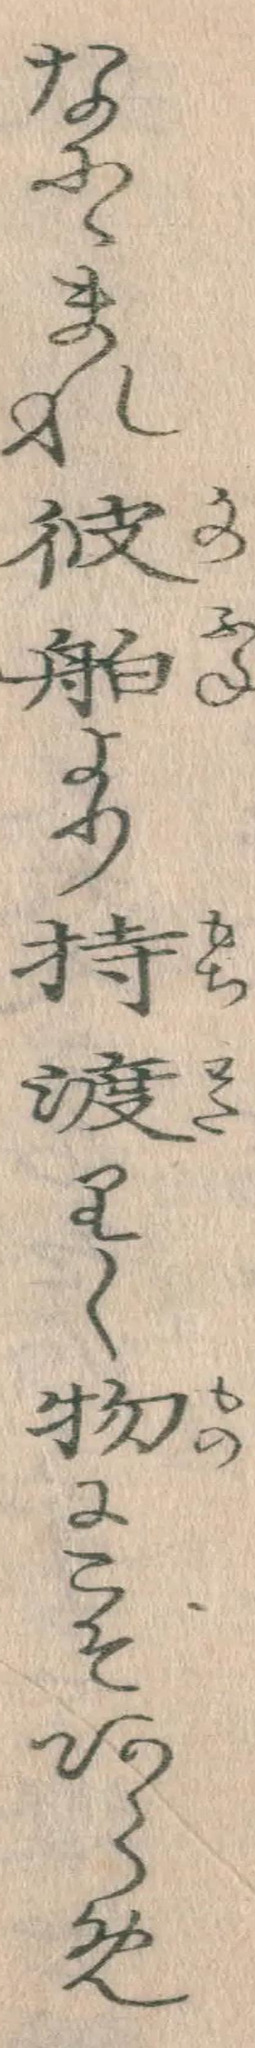なにゝまれ彼舶より持渡りし物にこそあらめ
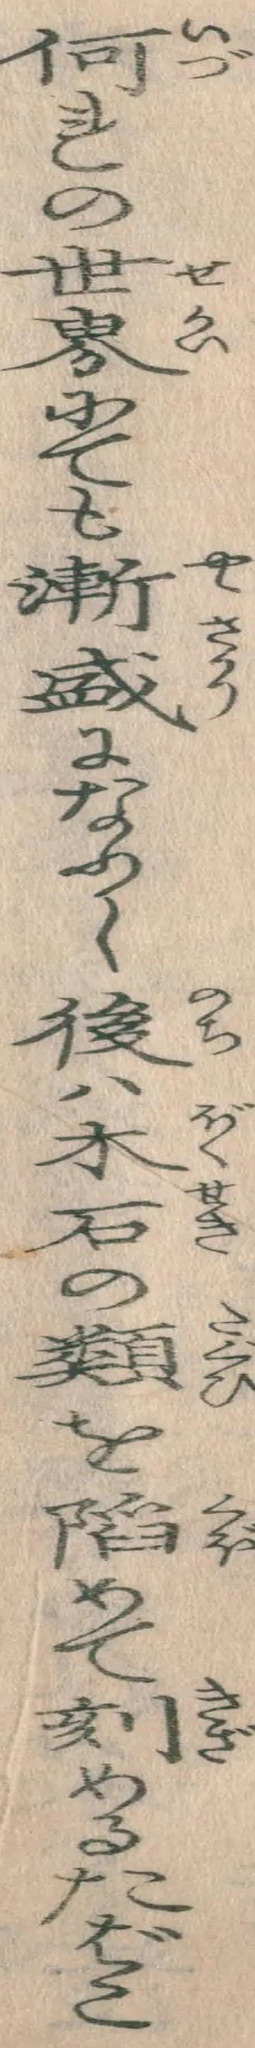何れの世界にても漸盛になりし後は木石の類を陥めて刻めるたばこ
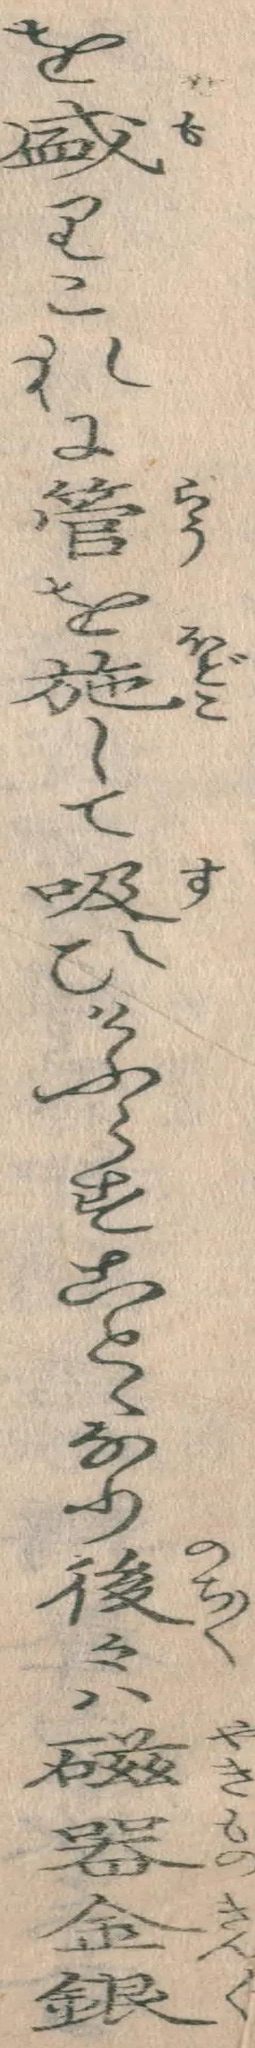を盛りこれに管を施して吸ひけふらすことゝなり後々は磁器金銀
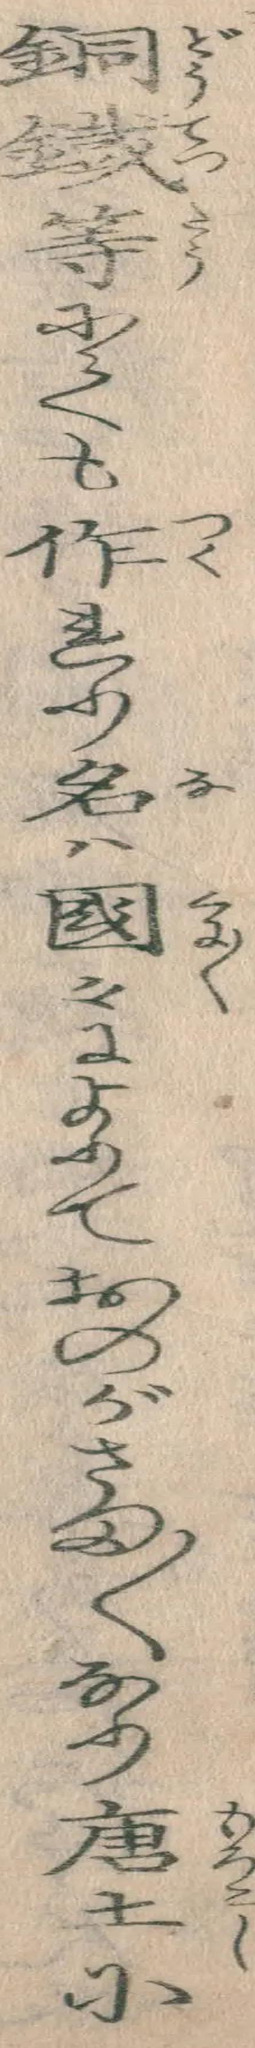銅鉄等にても作れり名は国々によりておのがさま〳〵なり唐土に
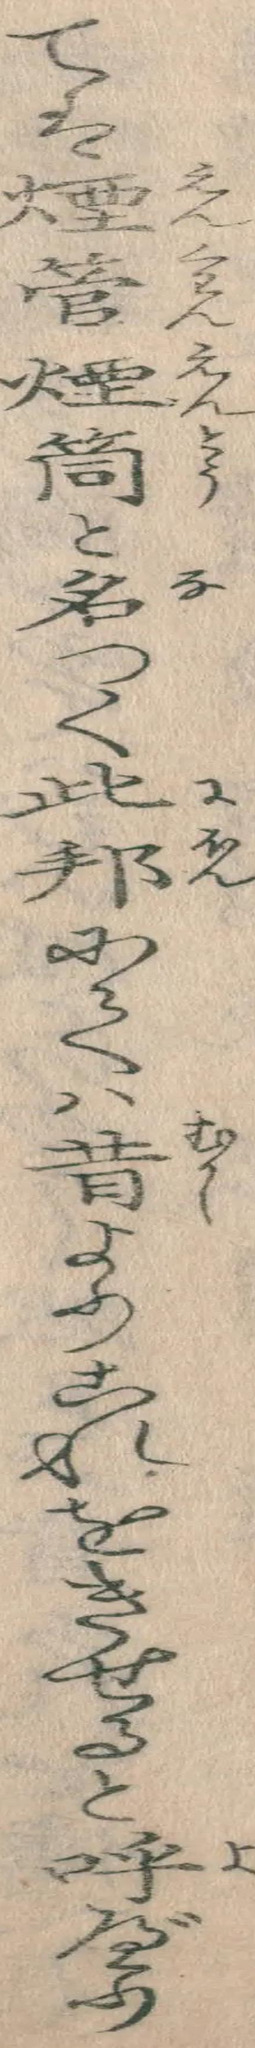ては煙管煙筒と名つく此邦にては昔よりこれをきせると呼べり
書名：目さまし草
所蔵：国立国会図書館 National Diet Library, JAPAN
